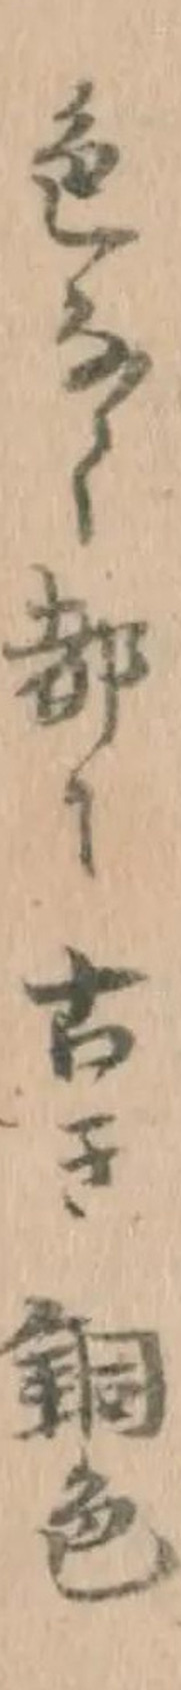色なく都て古き銅色
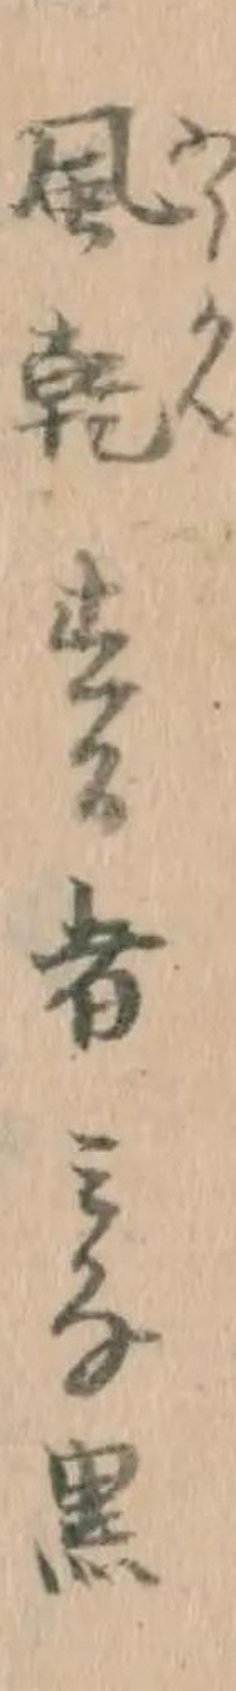風乾する者みな黒
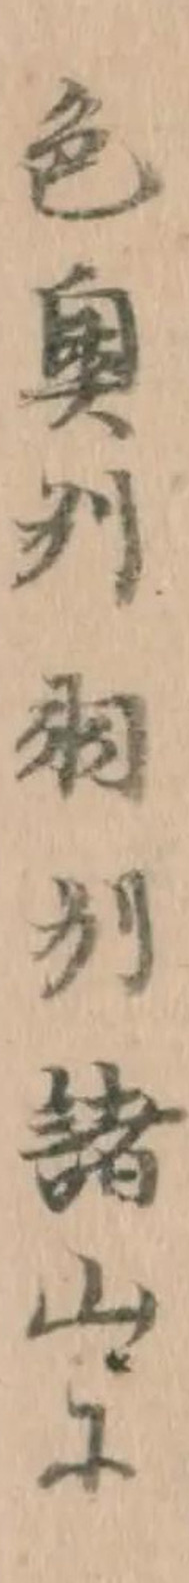色奥州羽州諸山に
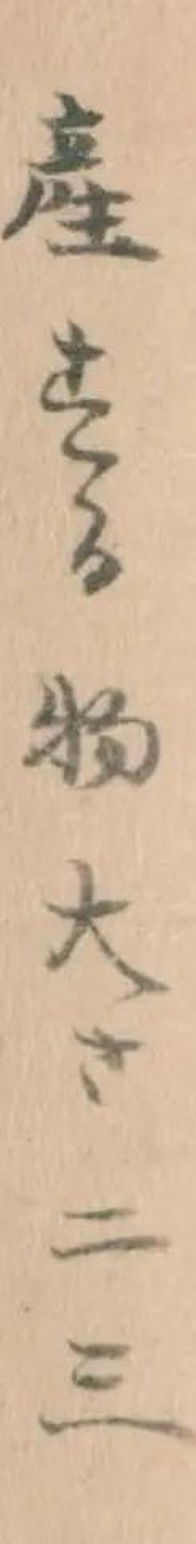産する物大さ二三
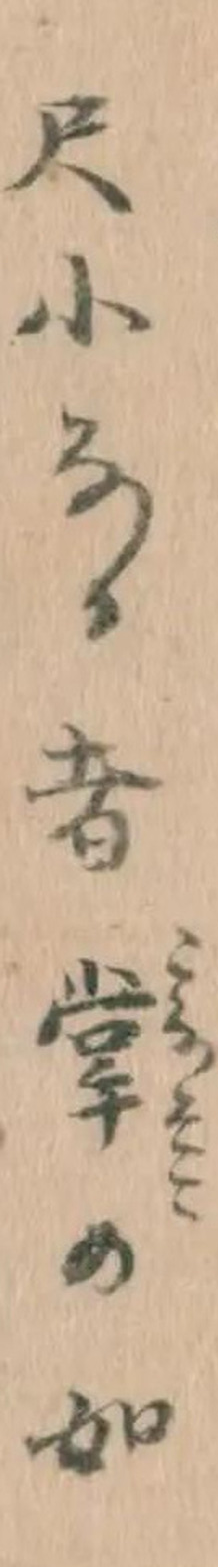尺小なる者掌の如
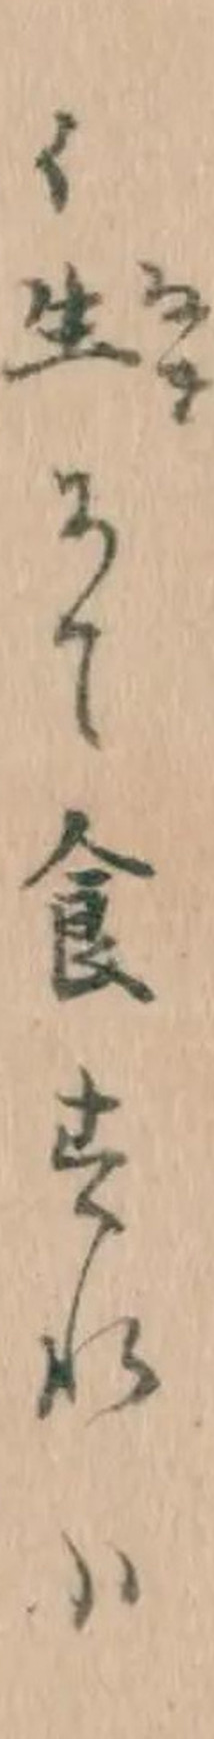く生にて食すれは
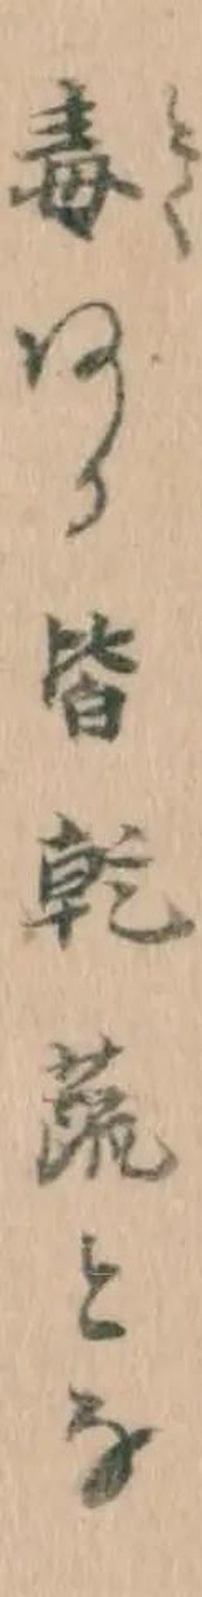毒あり皆乾蔬とな
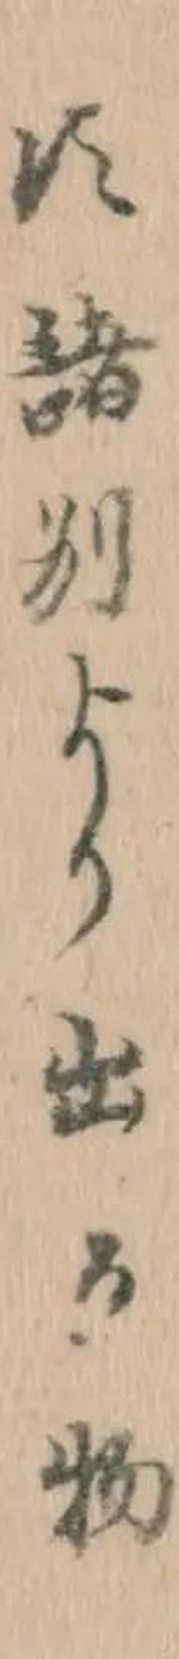す諸州より出る物
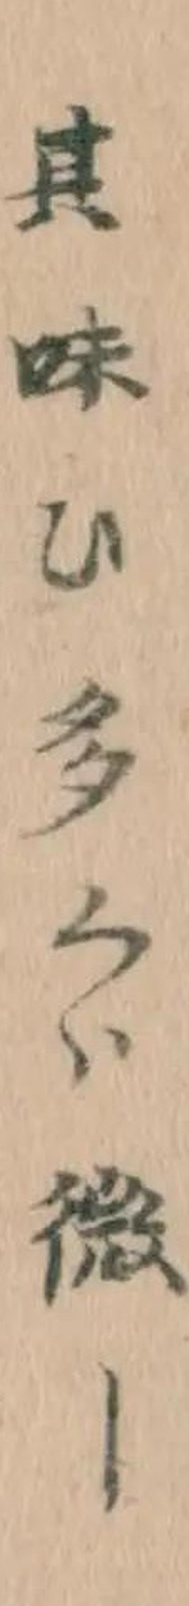其味ひ多くは微し
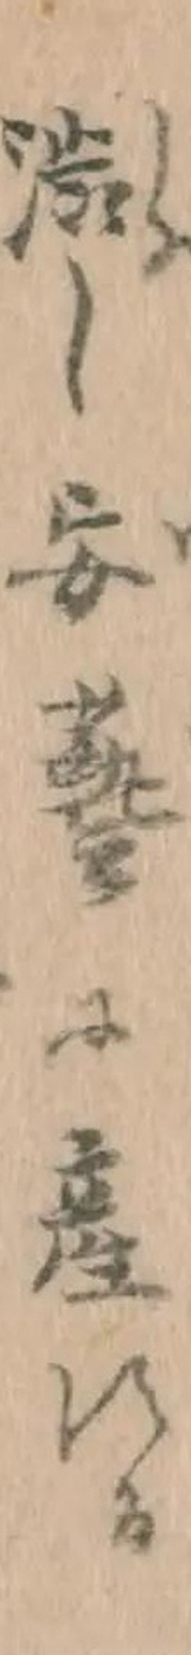渋し安芸に産する
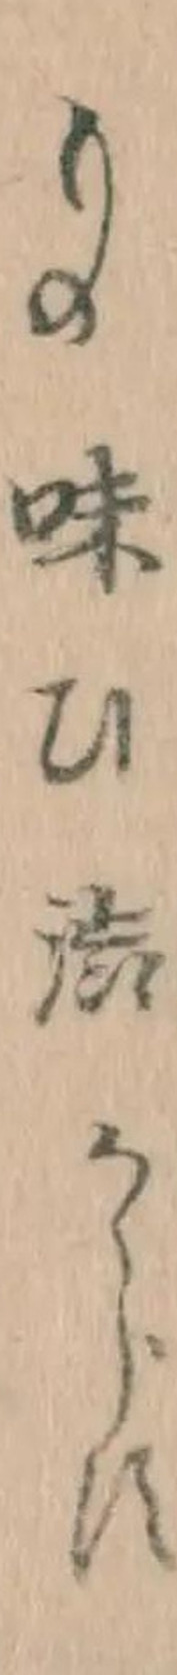もの味ひ渋からす
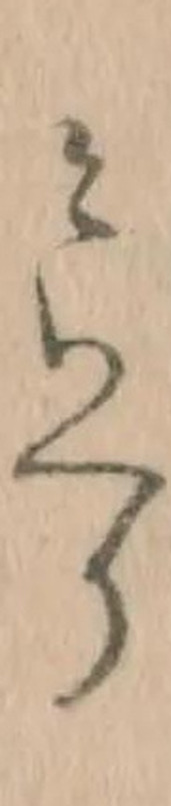といへり

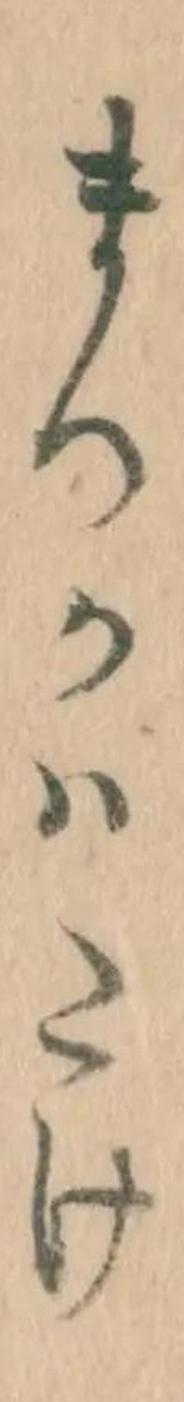まつかはたけ
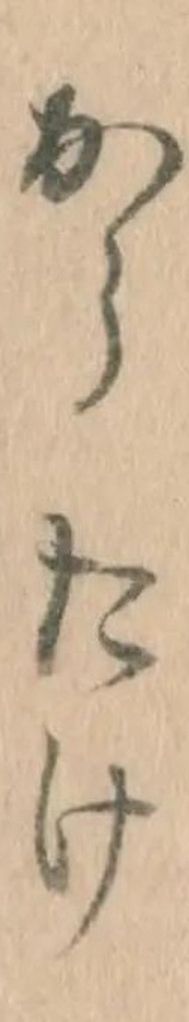からたけ
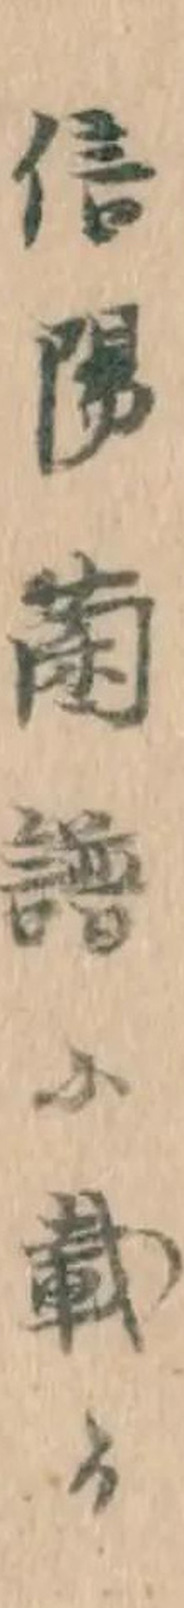信陽菌譜に載る
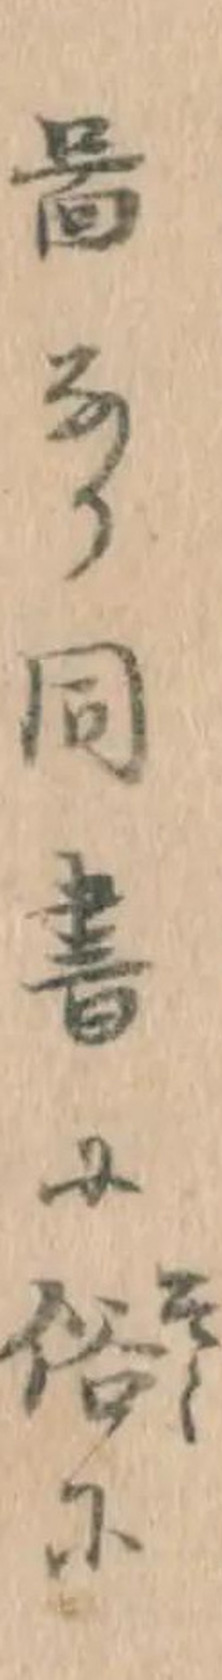図なり同書に俗に
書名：本草図譜. 巻55-57
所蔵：国立国会図書館 National Diet Library, JAPAN
